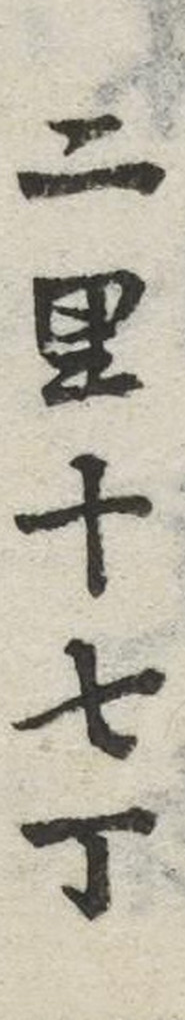二里十七丁
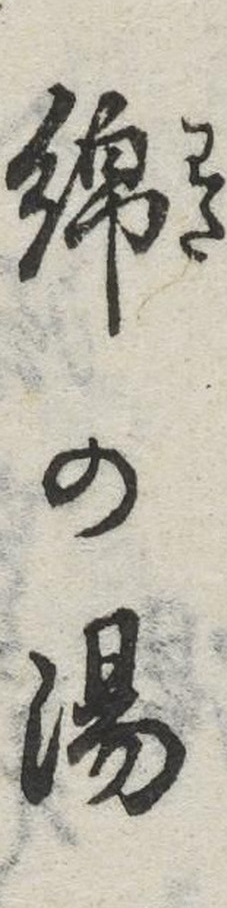綿の湯
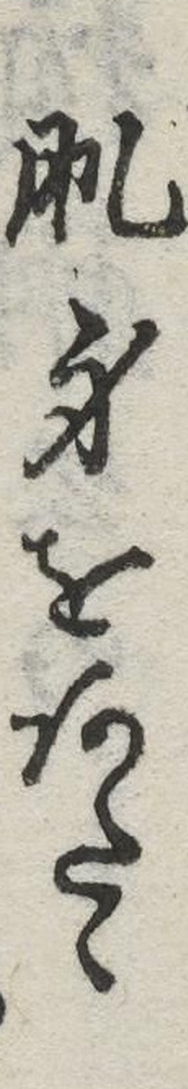肌身をあたゝ
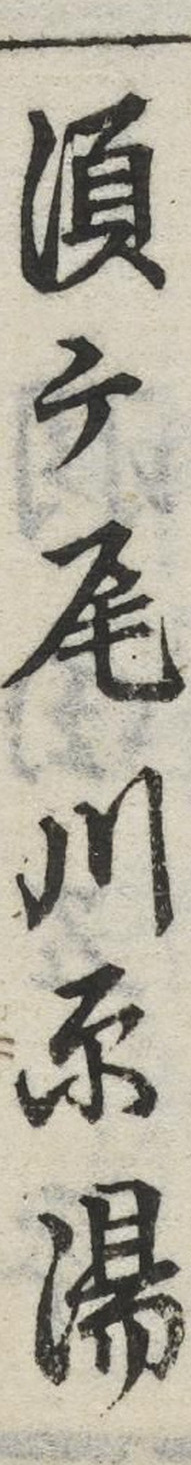須ケ尾川原湯
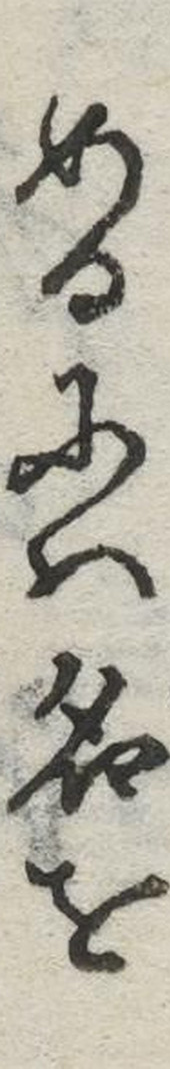めるには名を
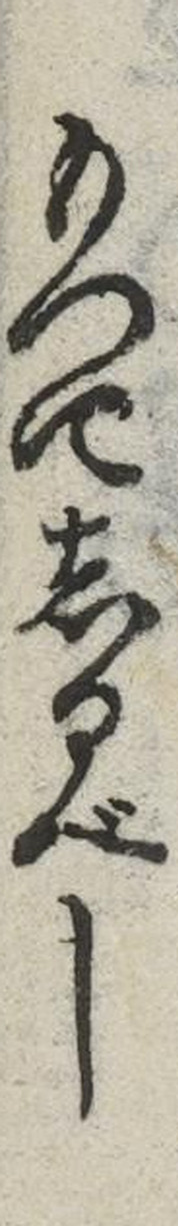もつてしるべし
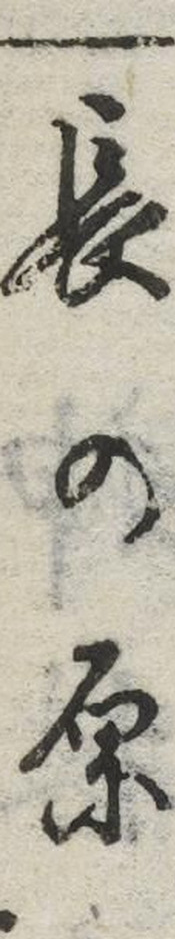長の原
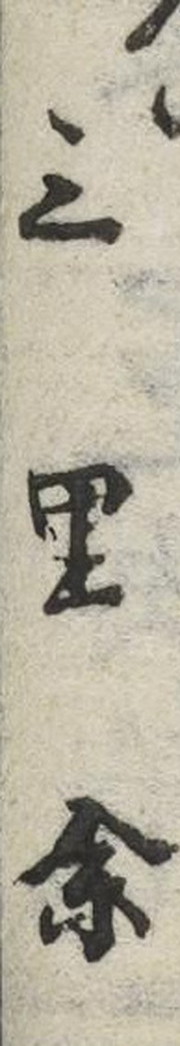三里余
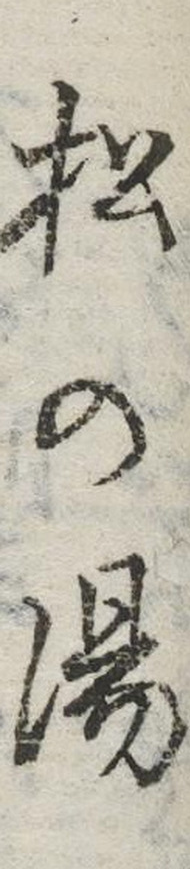松の湯
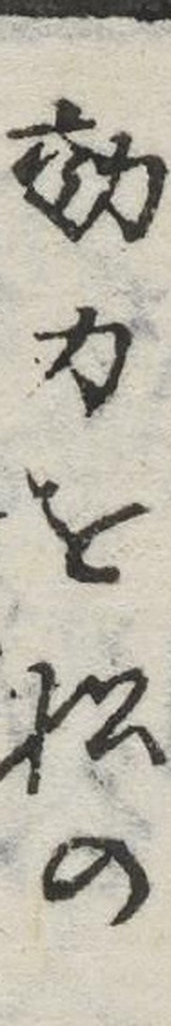効力を松の
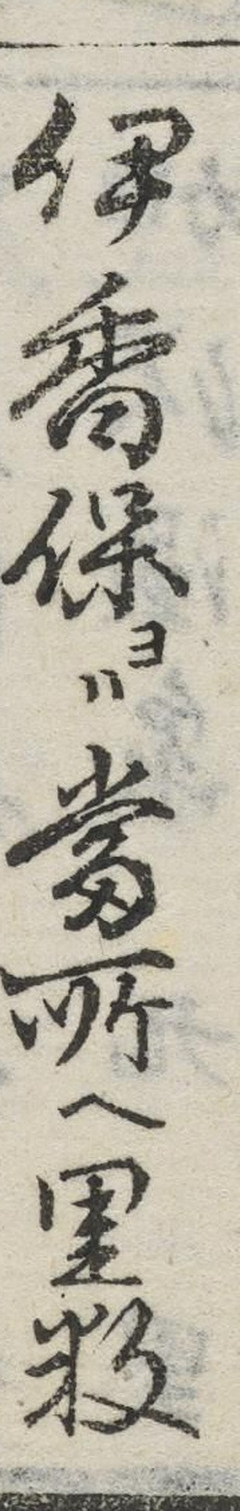伊香保ヨリ当所へ里程
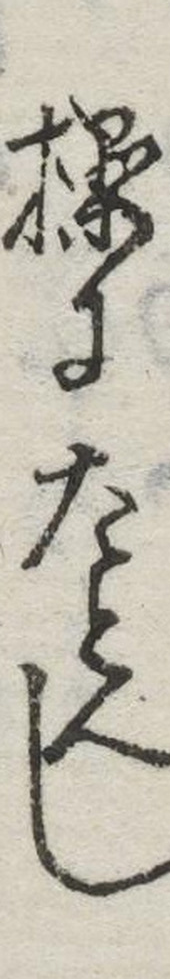操にたとへし
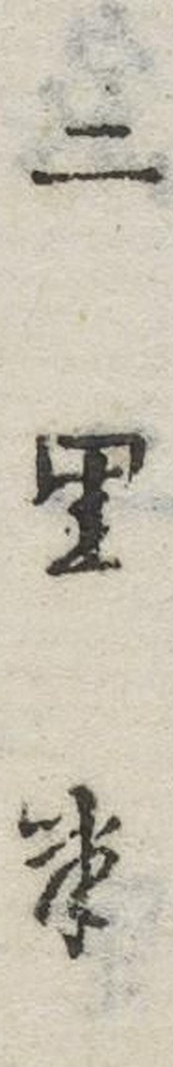二里半
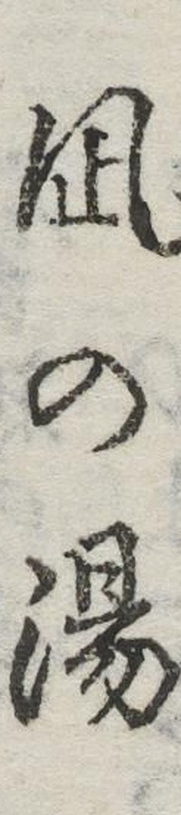凪の湯
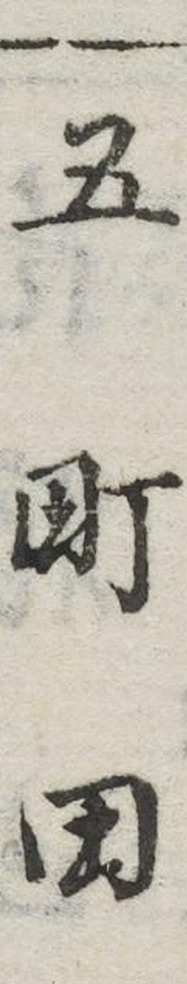五町田
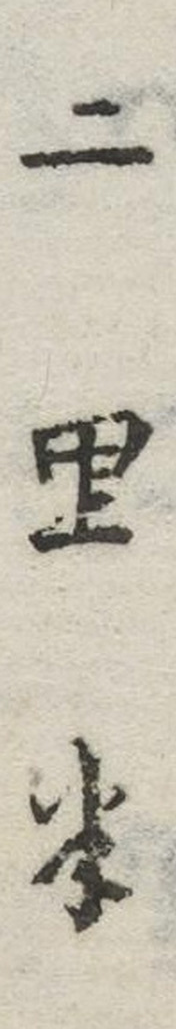二里半
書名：諸國温泉遊覽記　全
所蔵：東京大学地震研究所図書室 Earthquake Research Institute Library, The University of Tokyo, JAPAN
